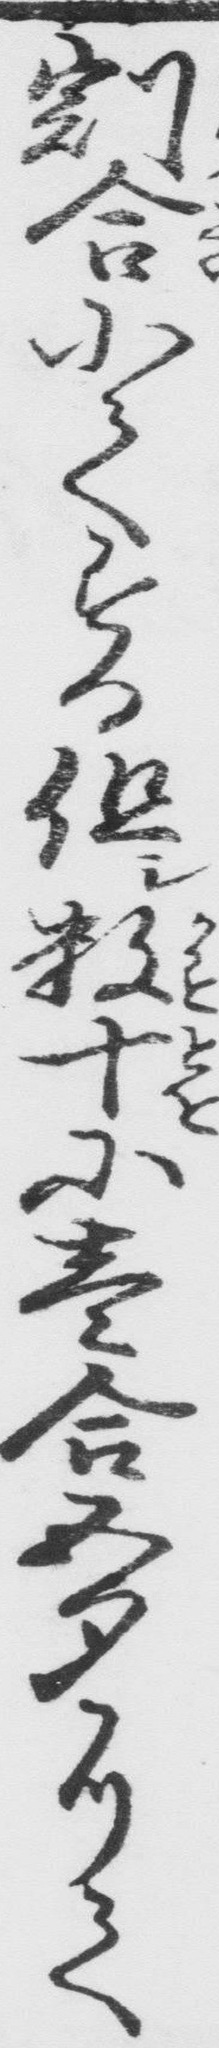割合にてする但し数十に壱合五勺にて
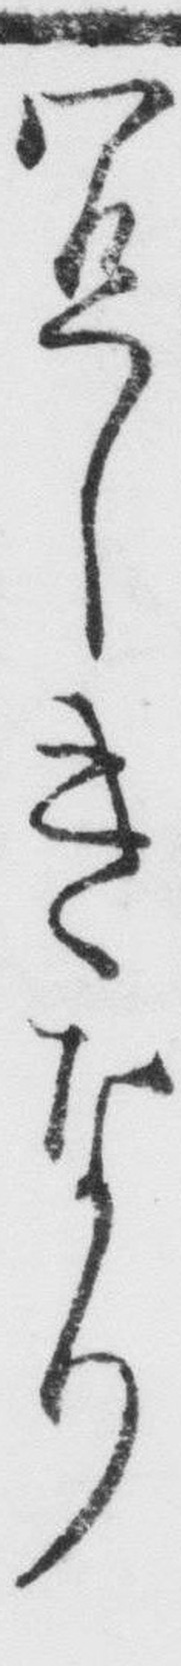宜しきなり
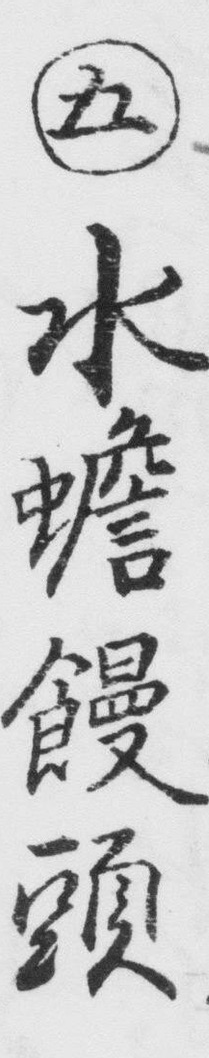(五)水蟾饅頭
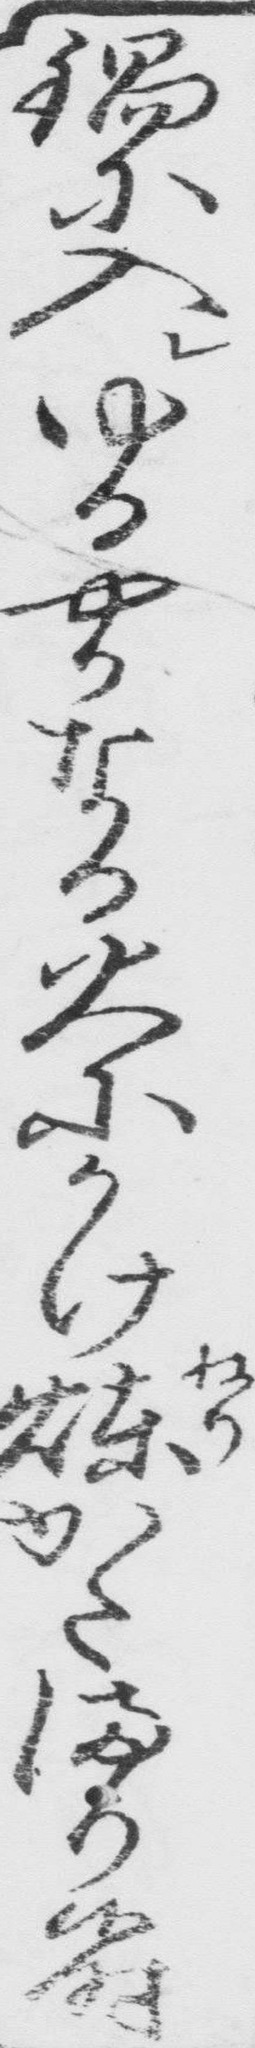鍋に入れゆるやかなる火にかけ煉かたまり候時

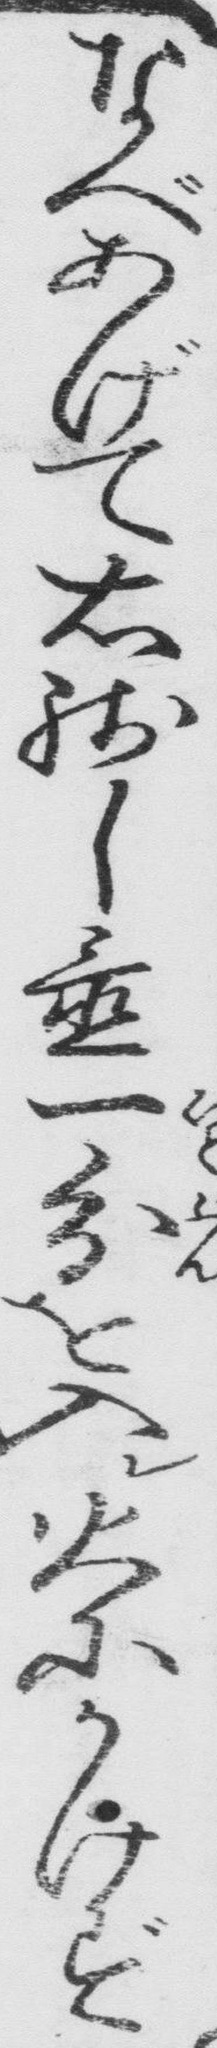なべあげて右残し置一分を入れ火にかけず
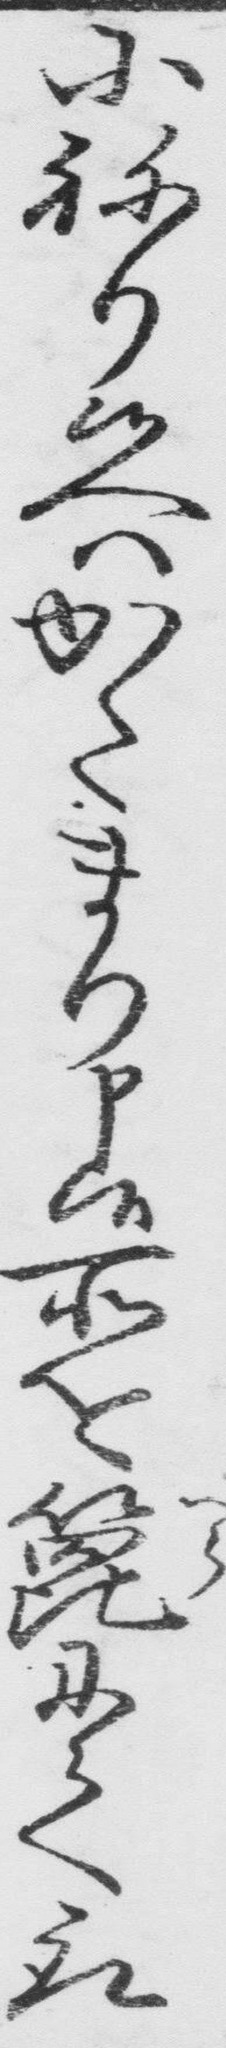にねり候へはかたまり申候所を箆にて取
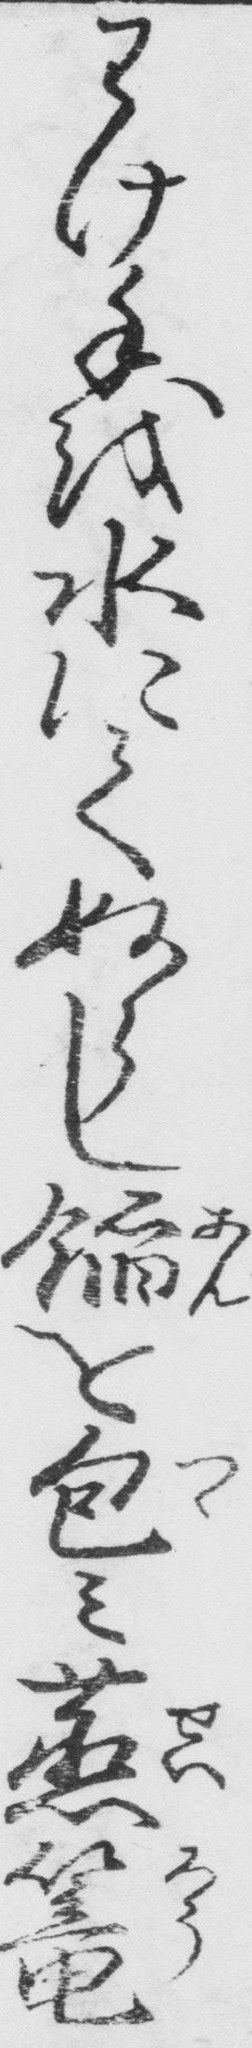わけ手を水にてぬらし餡を包み蒸篭
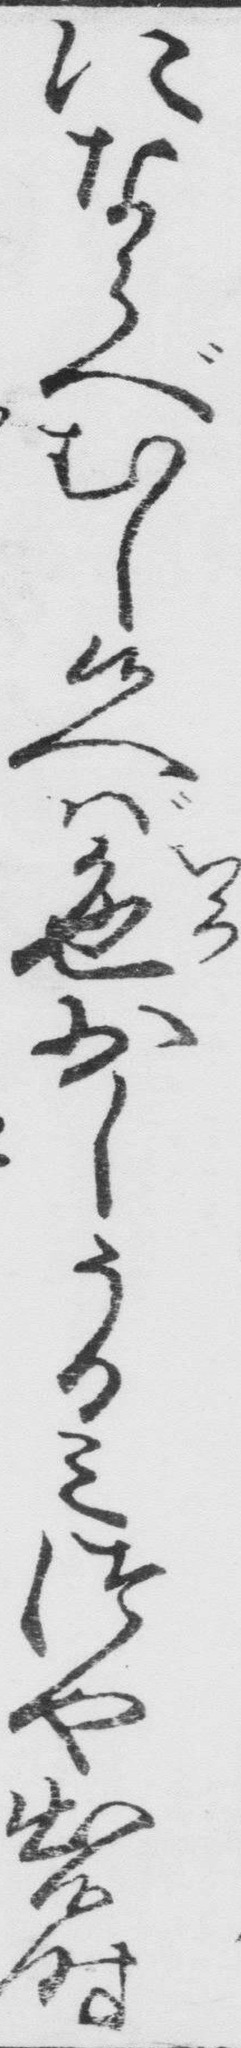にならべむし候へば色少しうるみつや出候時
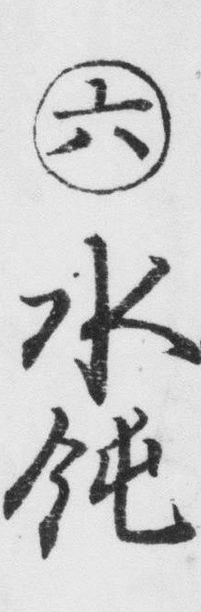(六)水飩
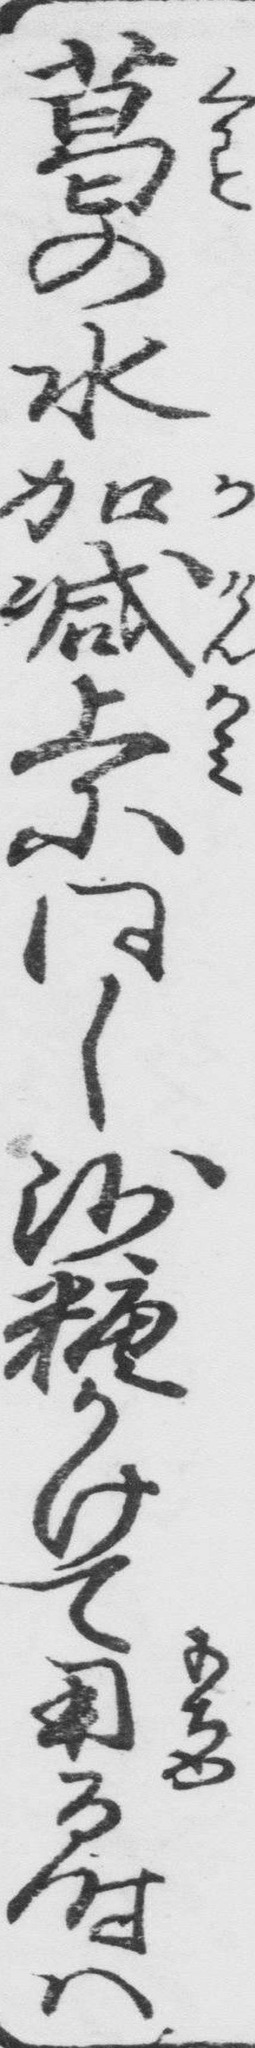葛の水加減上に同し沙糖かけて用る時は
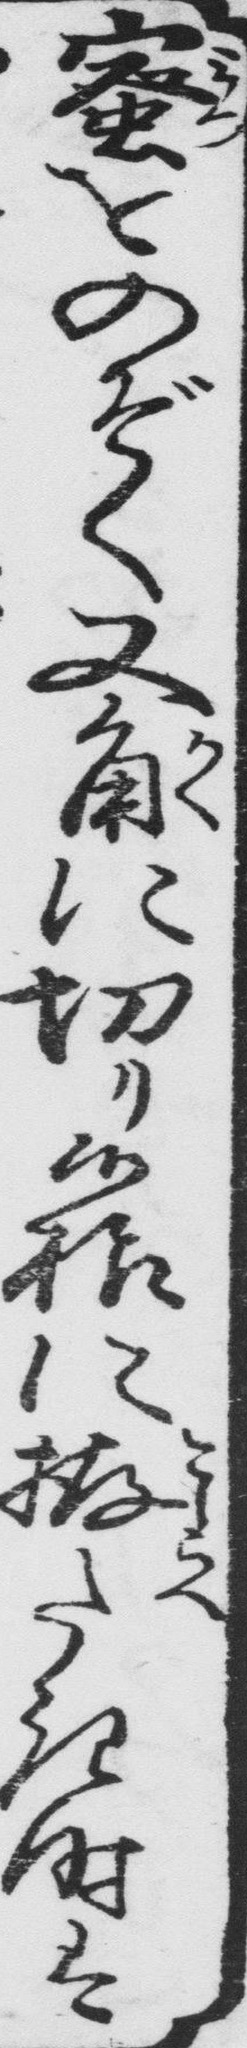蜜をのぞく又角に切り候様に拵たき時は
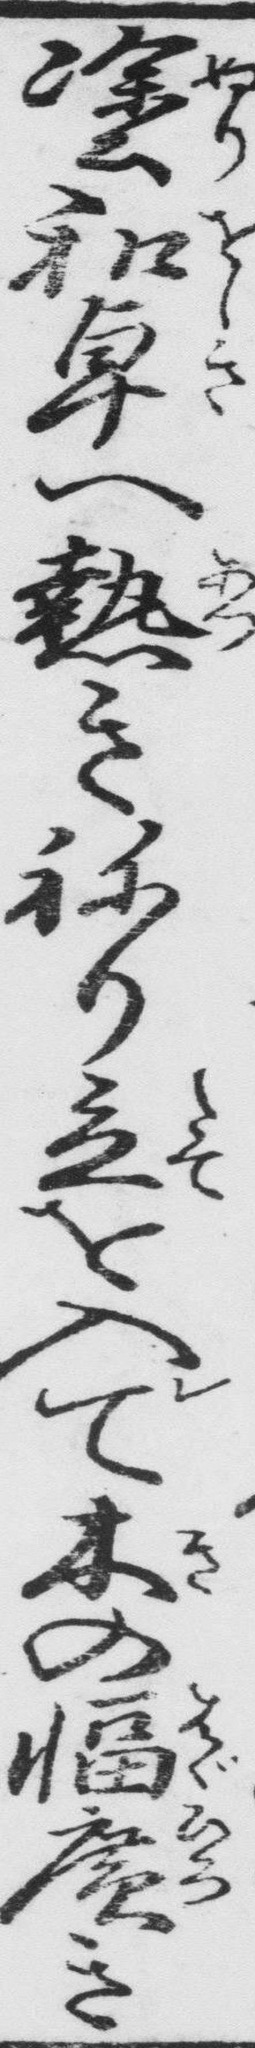塗和卓へ熱きねり立を入れて木の幅広き
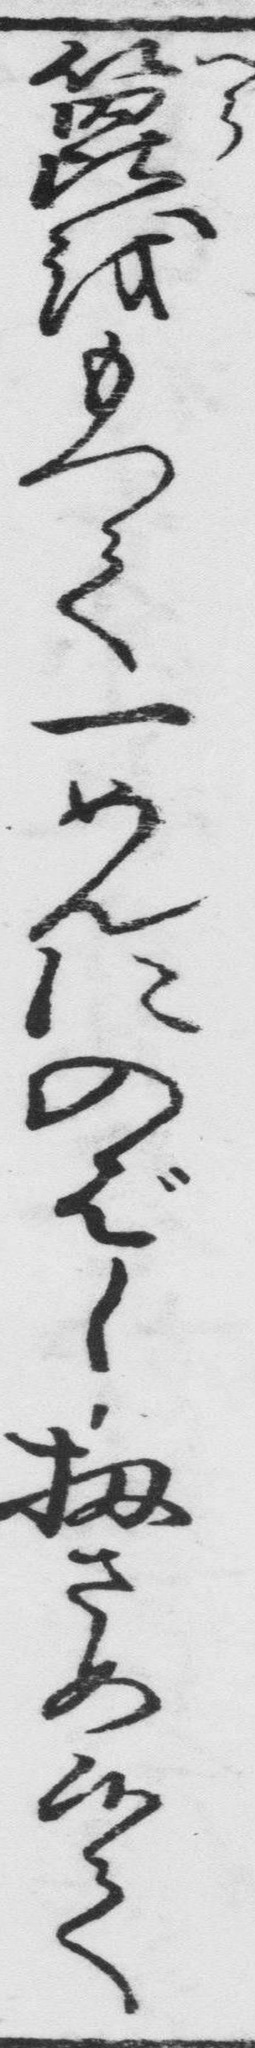箆をもつて一めんにのばし扨さめ候て
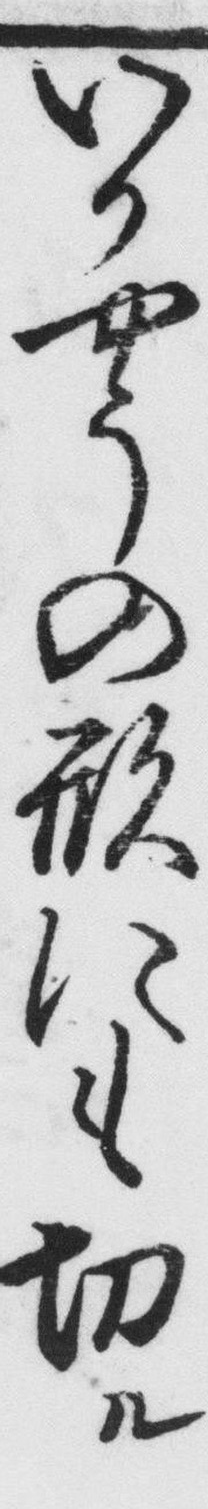いかやうの形にも切る
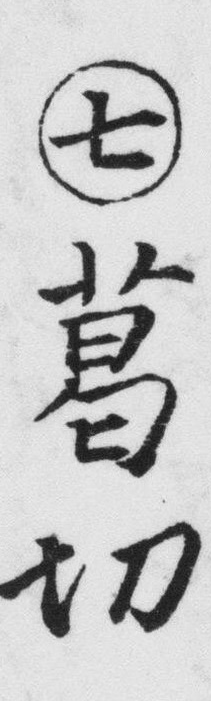(七)葛切
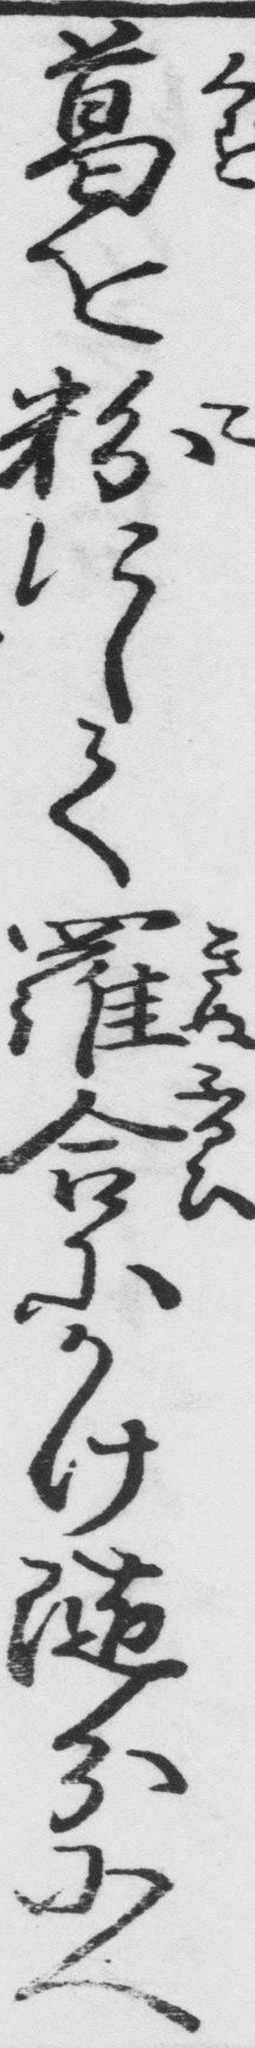葛を粉にして羅合にかけ随分にへ
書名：御前菓子図式
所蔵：大阪府立大学学術情報センター 国文学研究資料館
